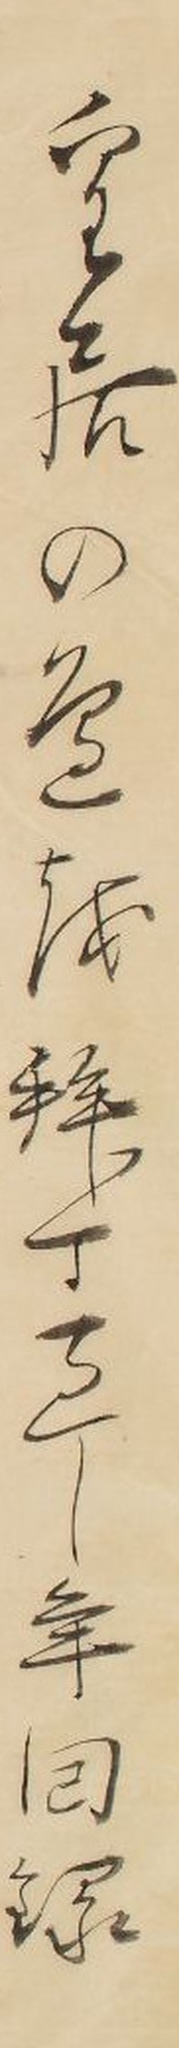皇居の辺を拝す過し年回録
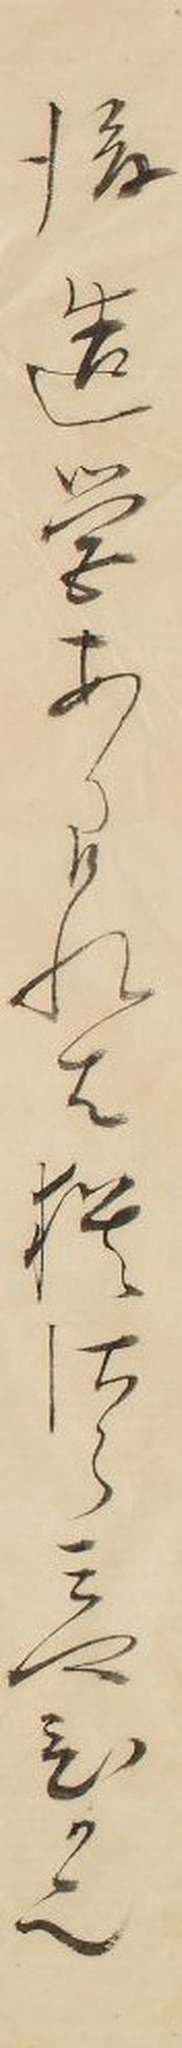後造営ありけれは猶さらみやひか也
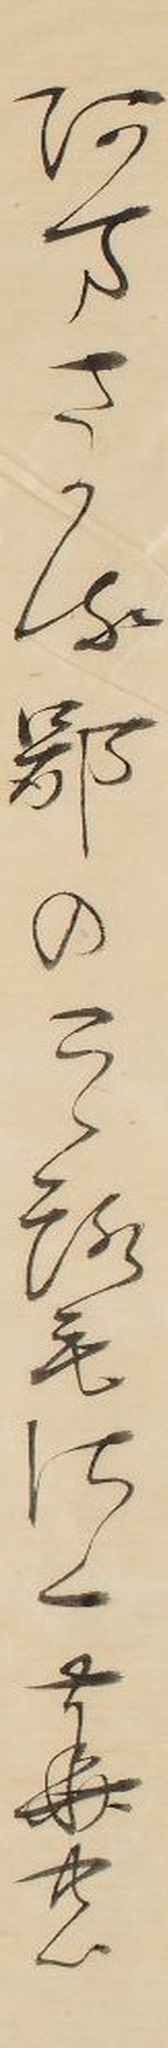あまさかる鄙のこゝろもさく華の
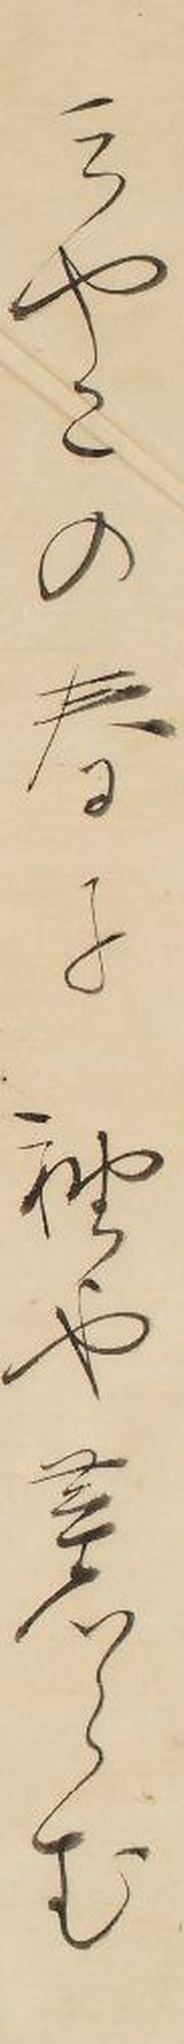みやこの春に袖や薫らむ
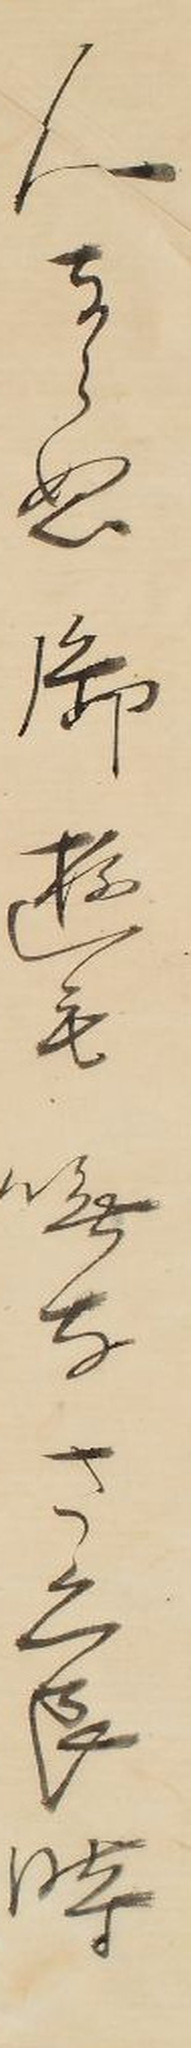人ならぬ御遊も嘸なさくら時
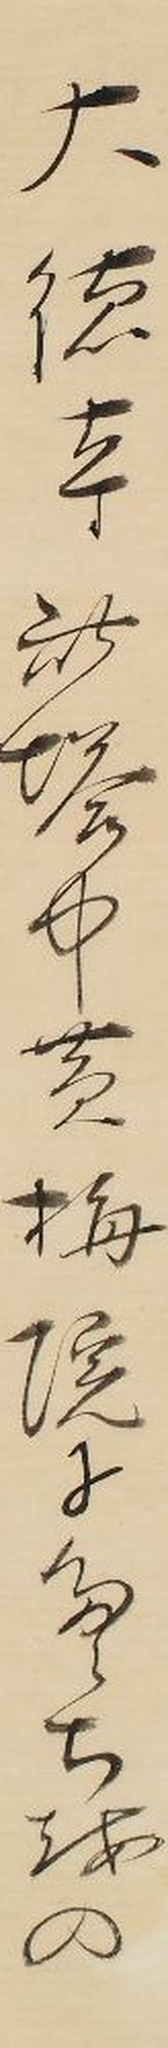大徳寺此塔中黄梅院にたらちをの
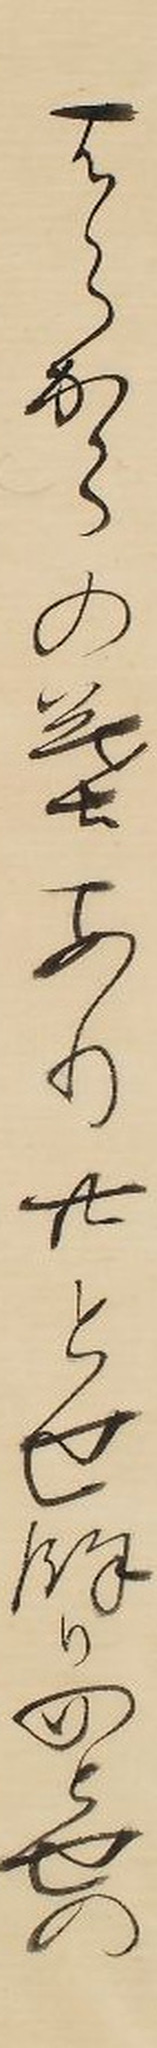はらからの墓あり廿とせ余り四とせの
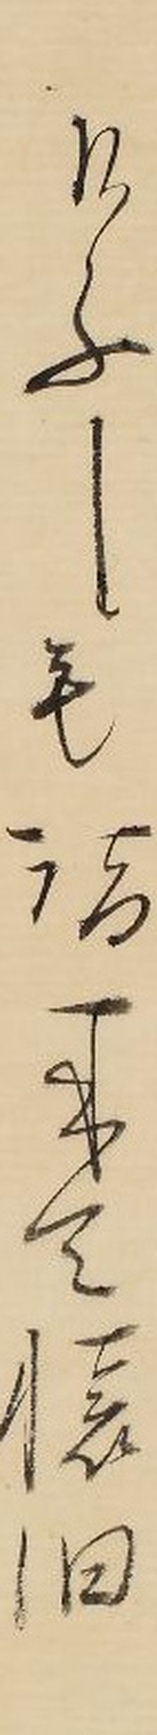けふしも詣来て懐旧
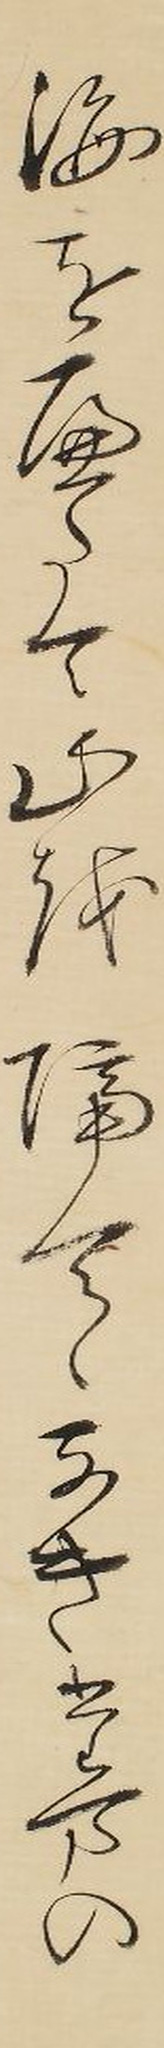海をへたて山を隔てゝなきたまの
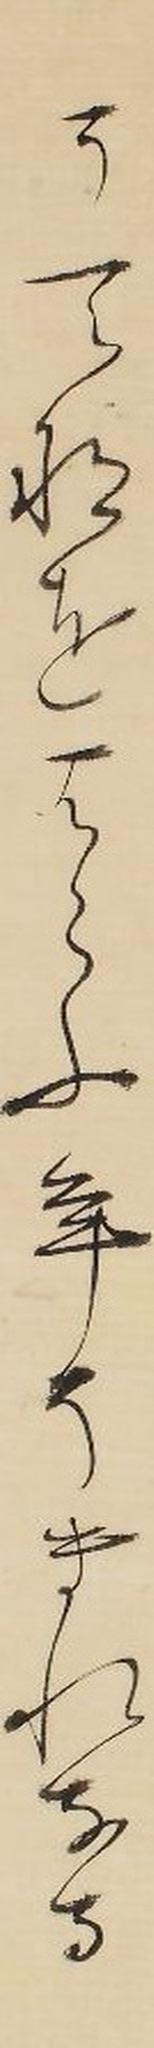うてなをはらふ年そまれなる
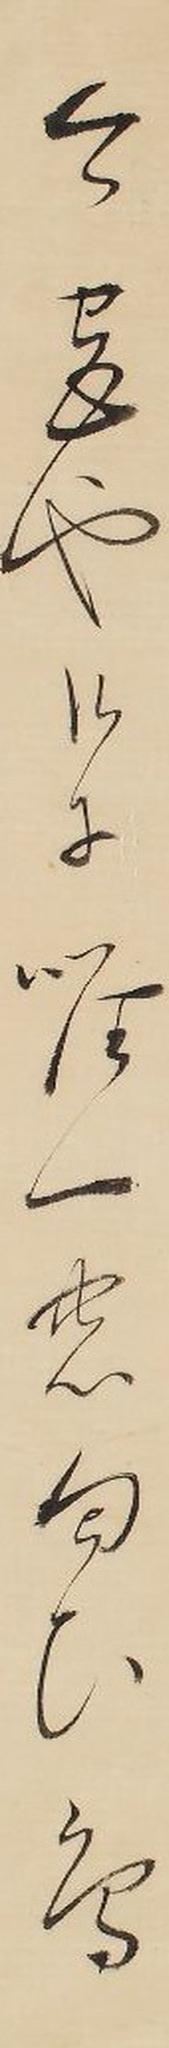今宮やけに唯一の匂ひ鳥
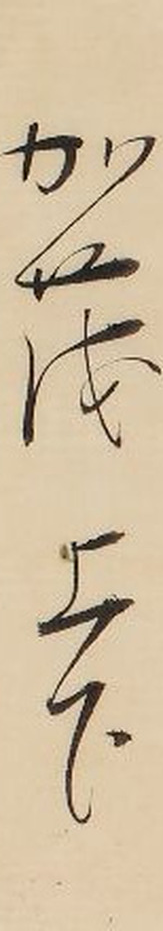加茂上下
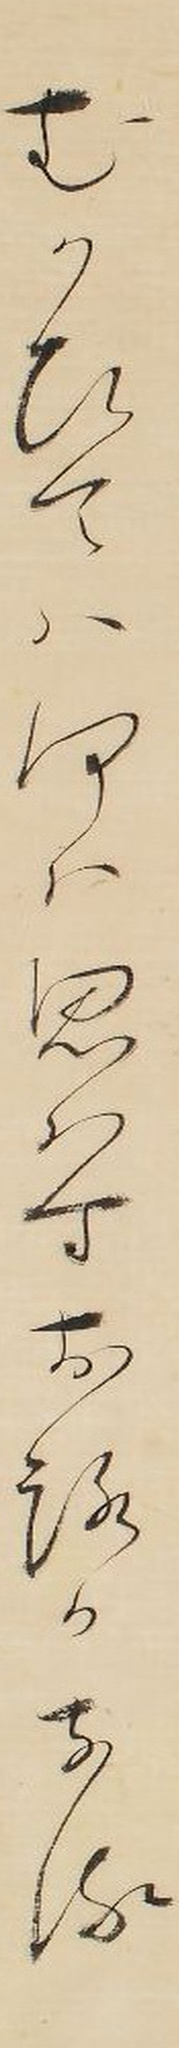むかひては何は思はすおろかなる
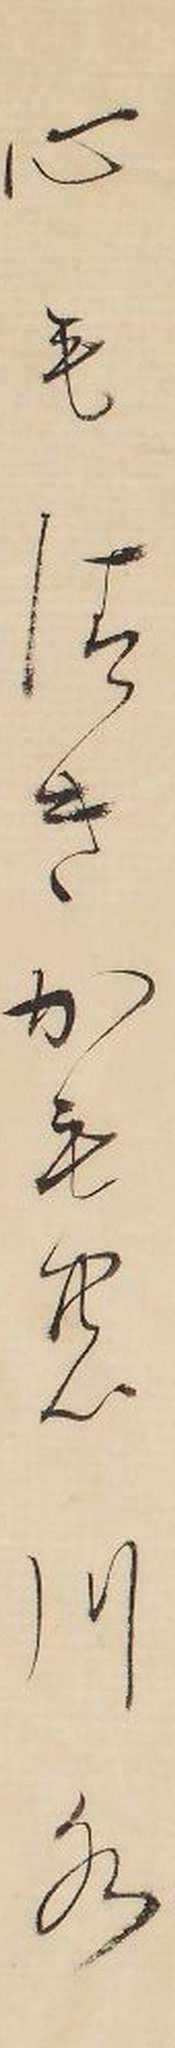心も清きかもの川水
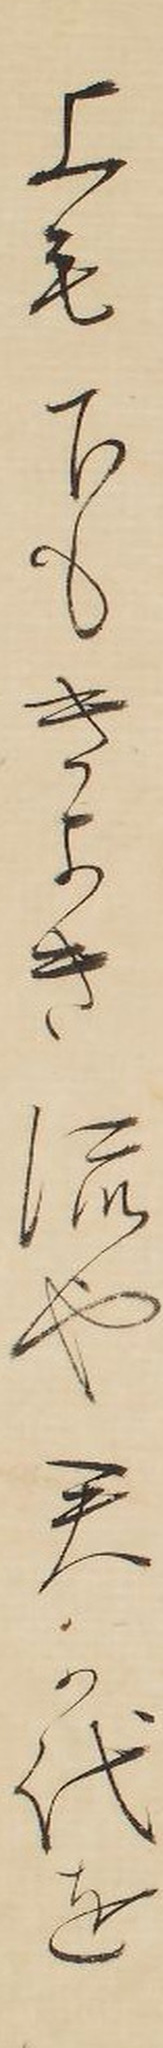上も下もきよき流や君か代を
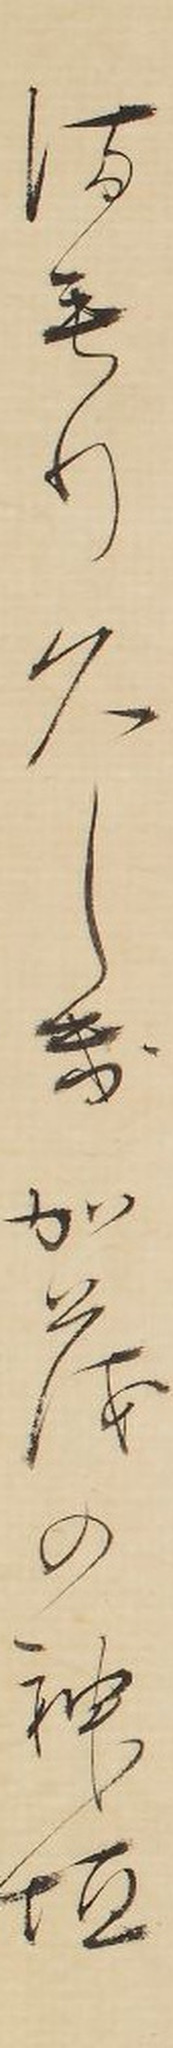まもり久しき加茂の神垣
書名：花土産
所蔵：徳島県立図書館
